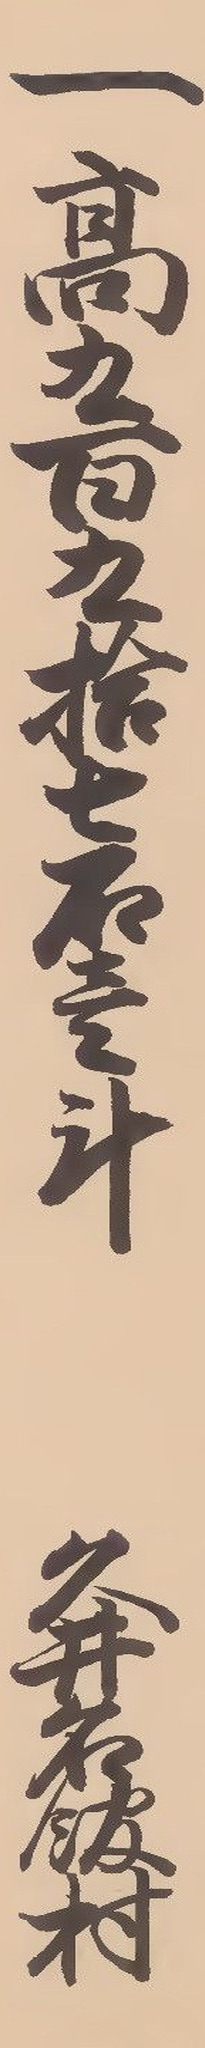一高九百九拾七石壱斗久井名舘村
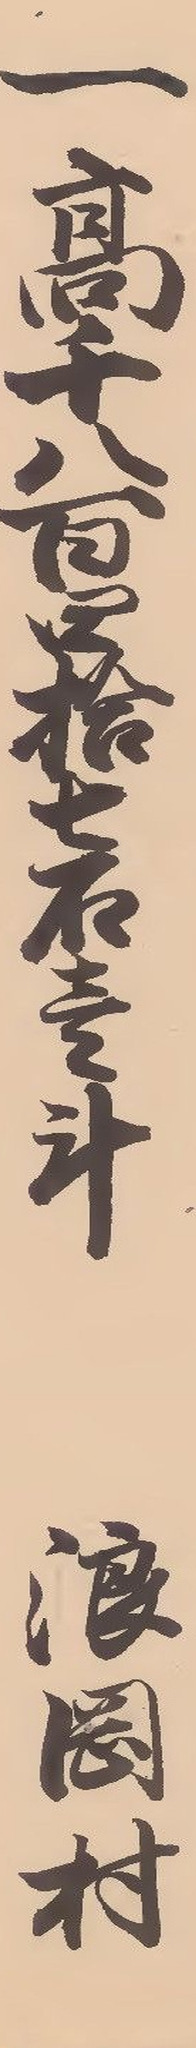一高千八百四拾七石壱斗浪岡村
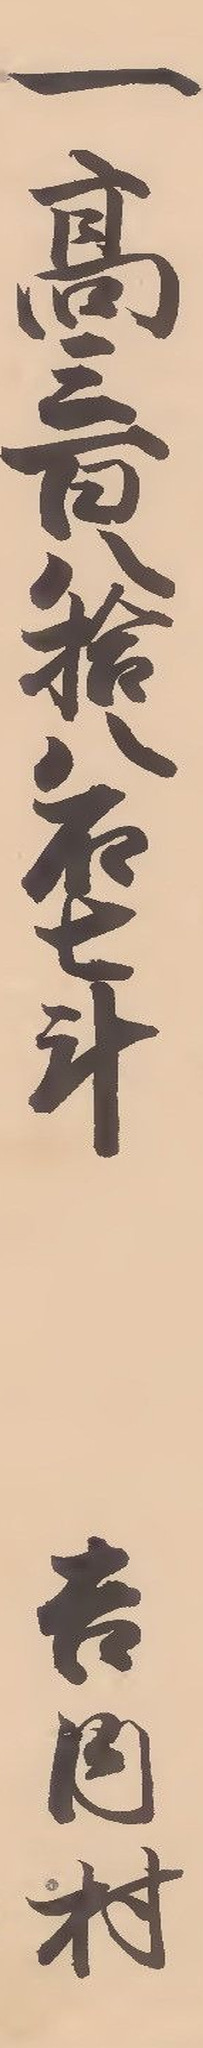一高三百八拾八石七斗吉内村

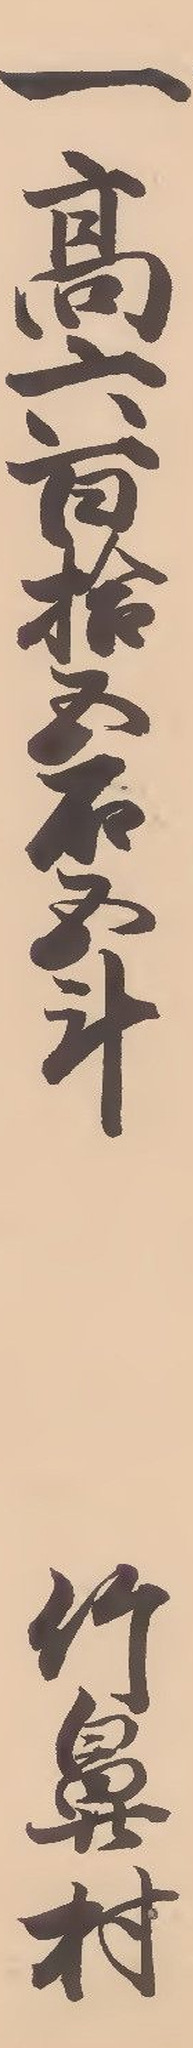一高六百拾五石五斗竹鼻村
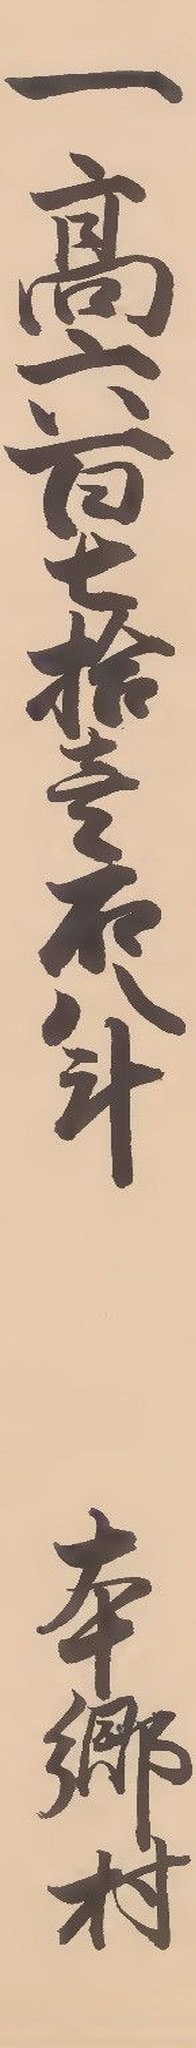一高六百七拾壱石八斗本郷村
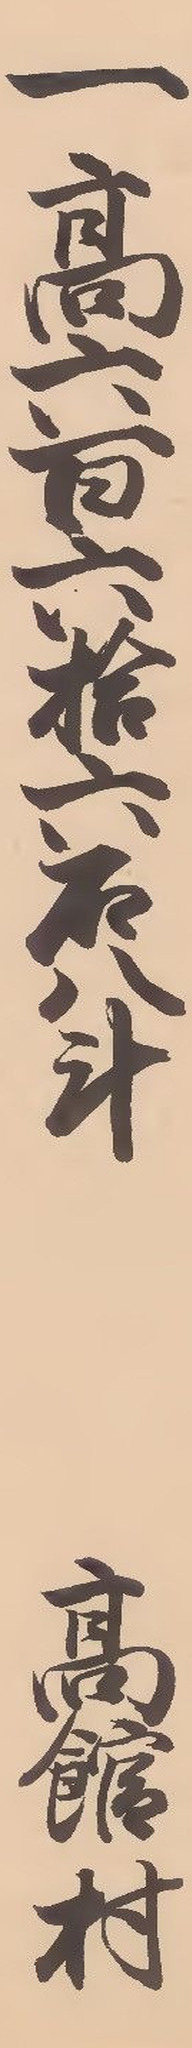一高六百六拾六石八斗高館村
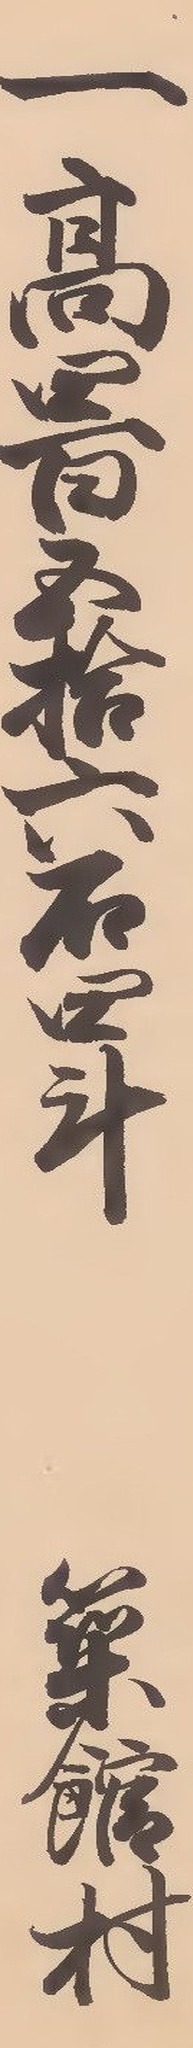一高四百五拾六石四斗築館村
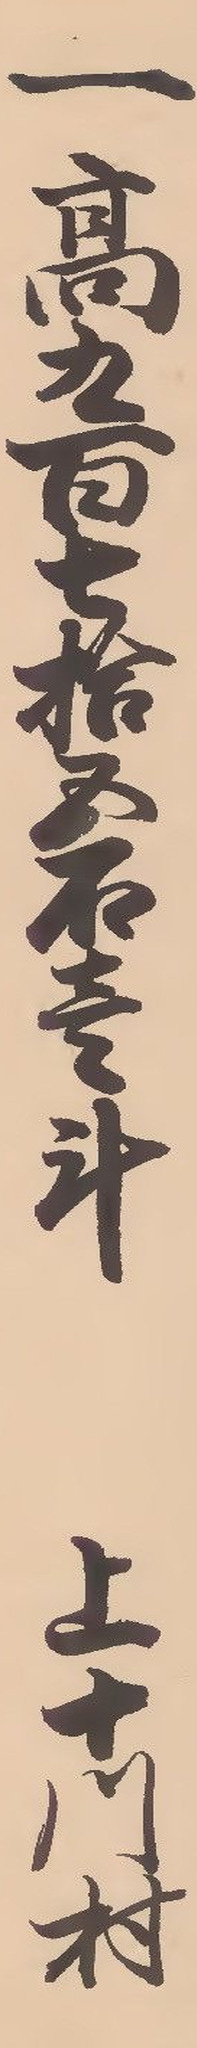一高九百七拾五石壱斗上十川村
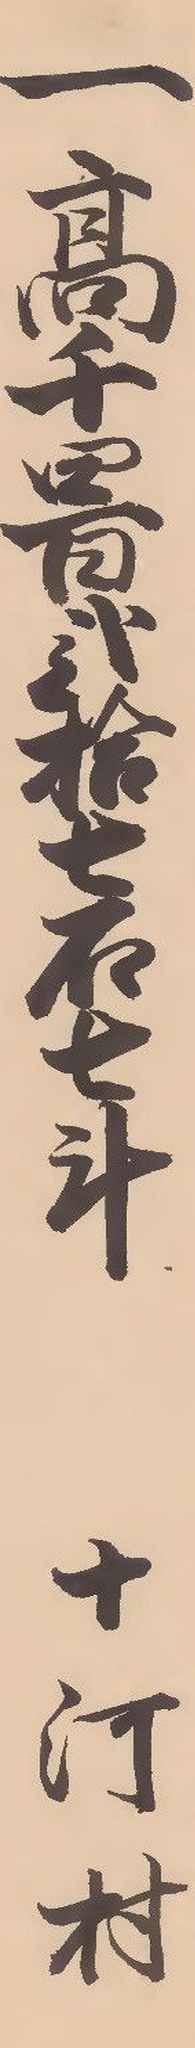一高千四百弐拾七石七斗十河村
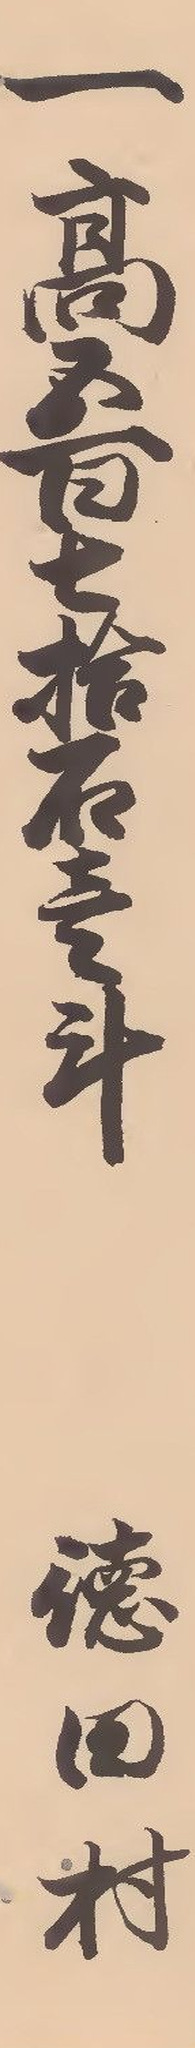一高五百七拾石壱斗徳田村

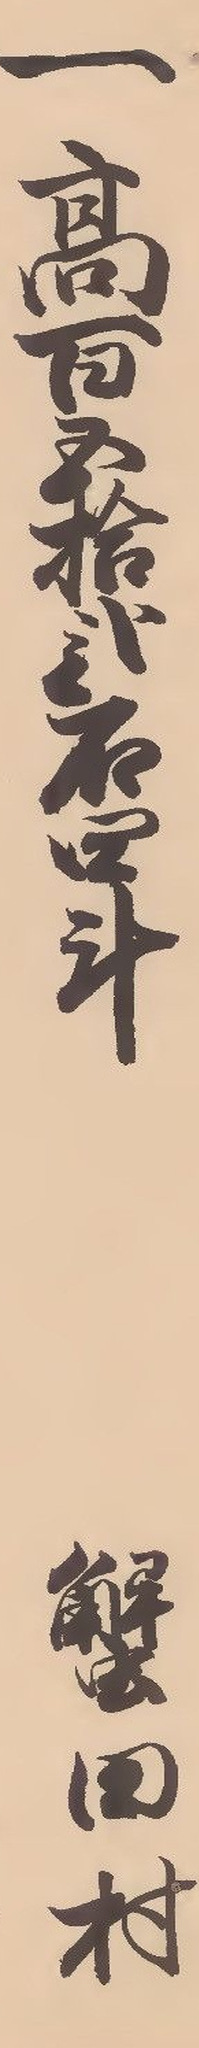一高百五拾弐石四斗蟹田村
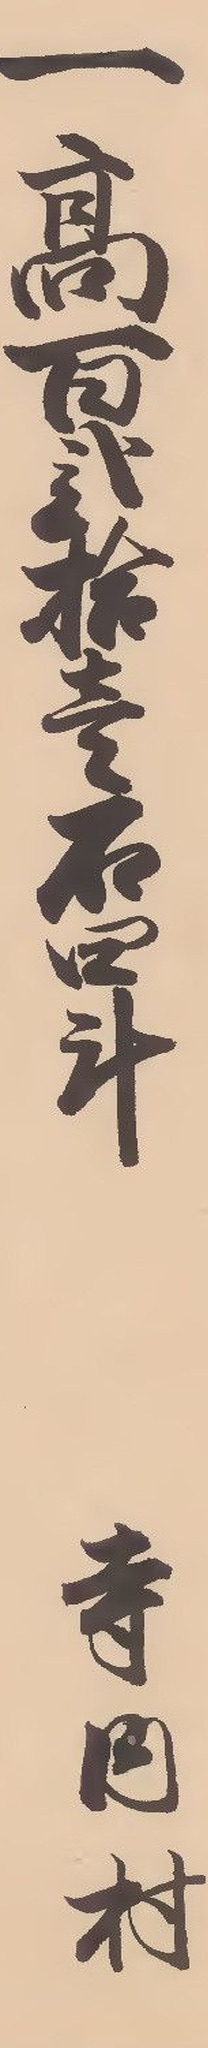一高百弐拾壱石四斗寺内村
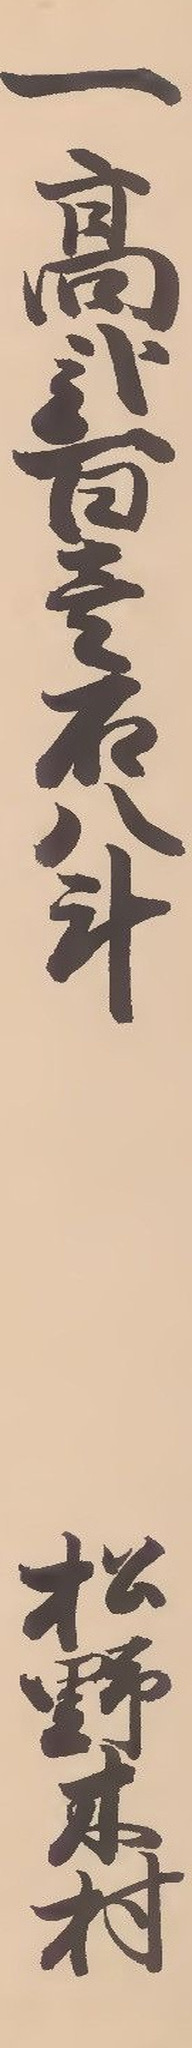一高弐百壱石八斗松野木村
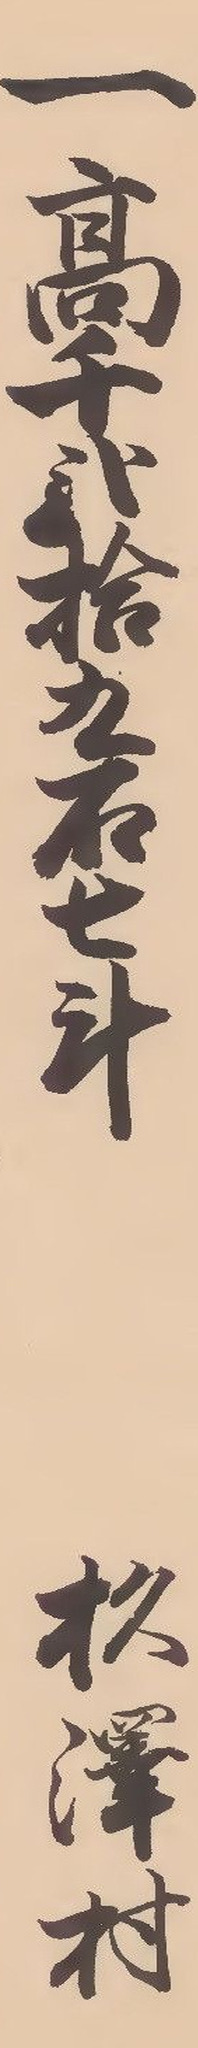一高千弐拾九石七斗杉沢村
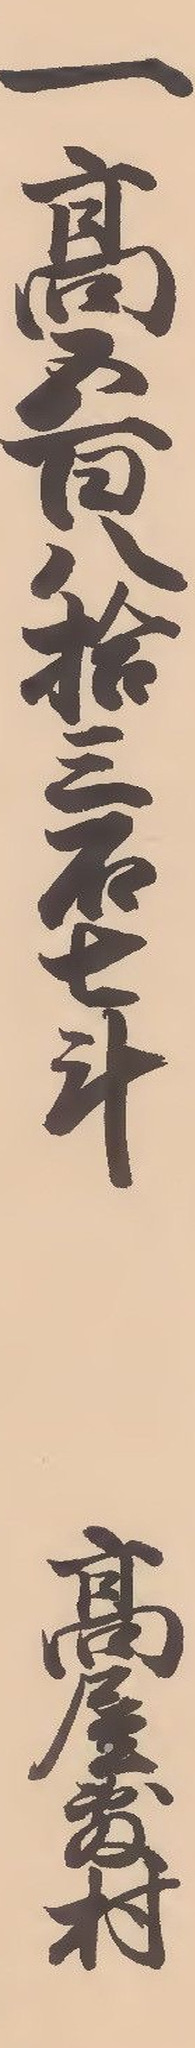一高五百八拾三石七斗高屋敷村
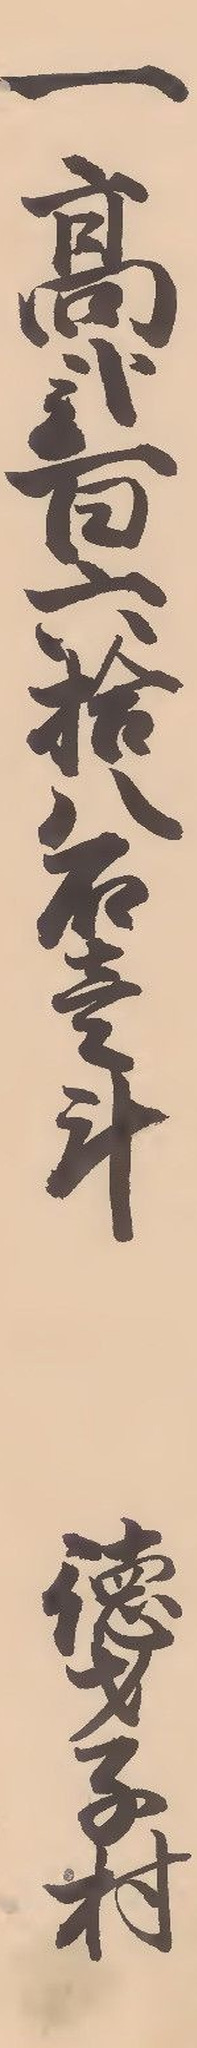一高弐百六拾八石壱斗徳才子村
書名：陸奥国郷帳　７
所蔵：国立公文書館 National Archives of Japan
